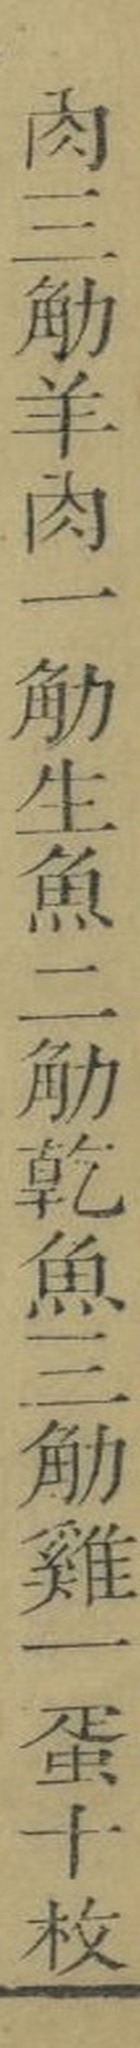肉三觔羊肉一觔生魚二觔乾魚三觔雞一蛋十枚
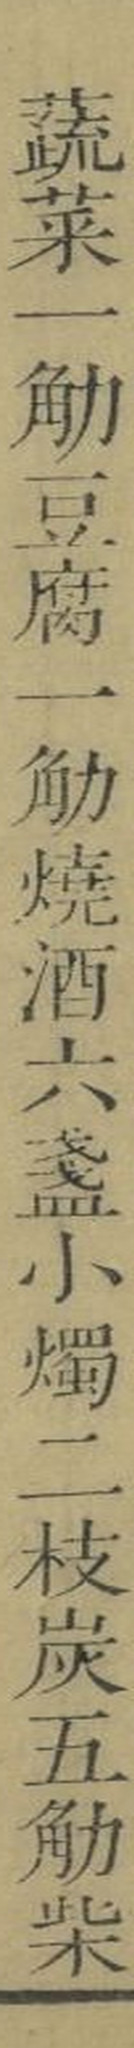蔬菜一觔豆腐一觔燒酒六盞小燭二枝炭五觔柴
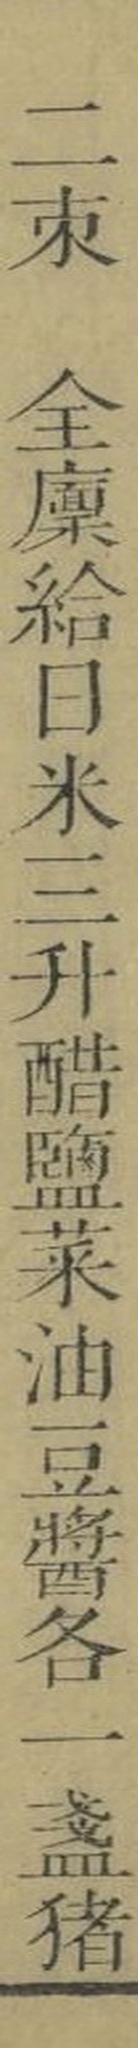二束全廩給日米三升醋鹽菜油豆醬各一盞猪
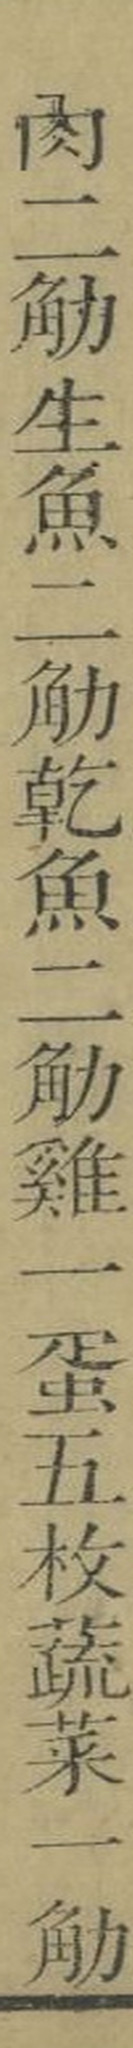肉二觔生魚二觔乾魚二觔雞一蛋五枚蔬菜一觔
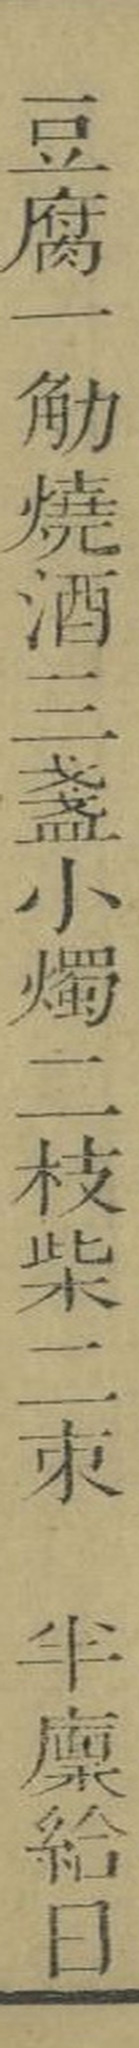豆腐一觔燒酒三盞小燭二枝柴二束半廩給日
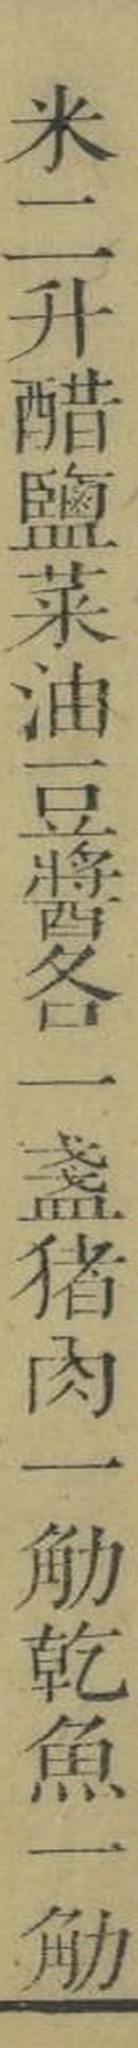米二升醋鹽菜油豆醬各一盞猪肉一觔乾魚一觔
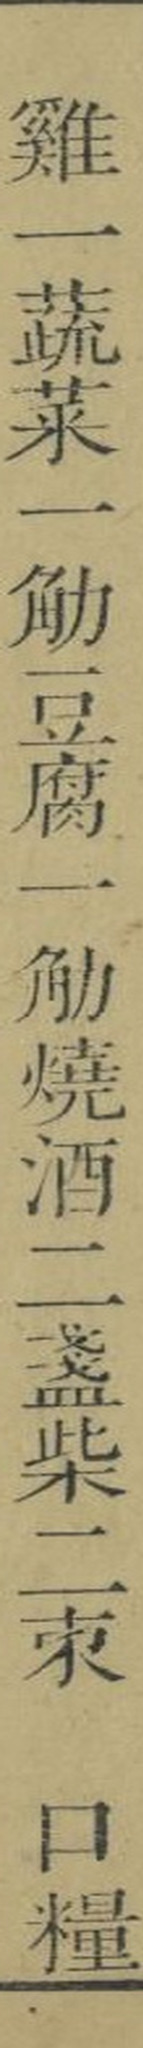雞一蔬菜一觔豆腐一觔燒酒二盞柴二束口糧
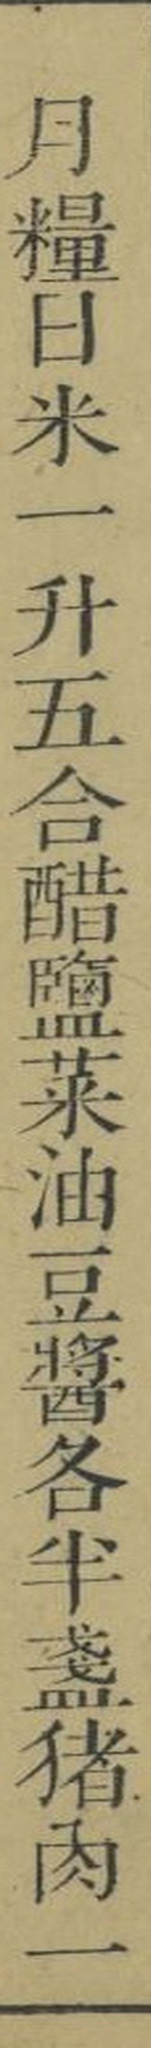月糧日米一升五合醋鹽菜油豆醬各半盞猪肉一
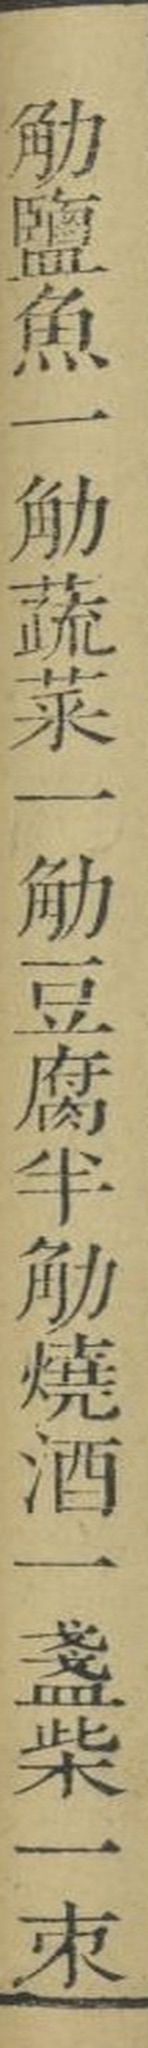觔鹽魚一觔蔬菜一觔豆腐半觔燒酒一盞柴一束
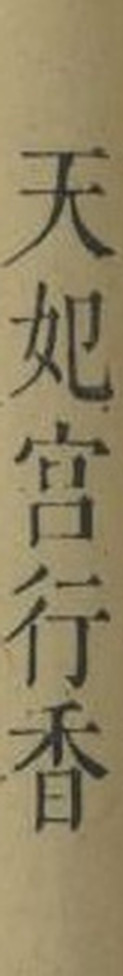天妃宫行香
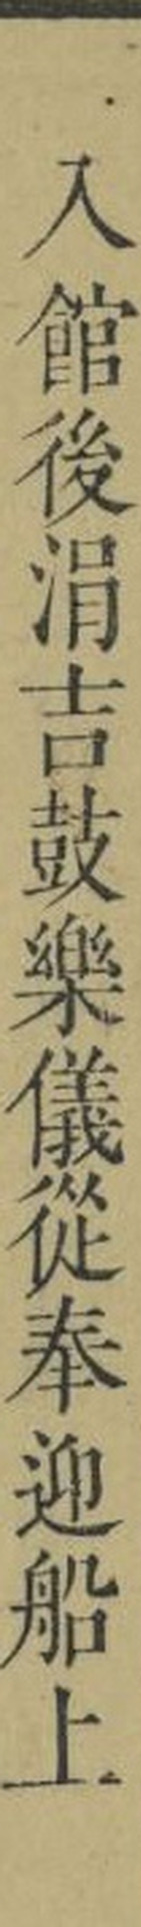入館後涓吉鼓樂儀從奉迎船上
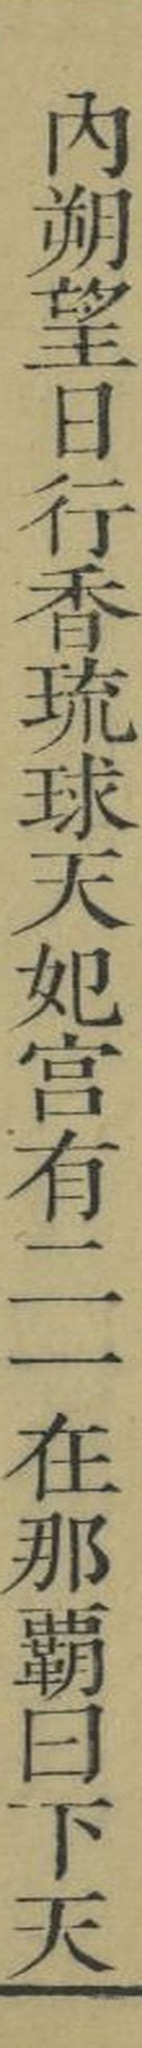内朔望日行香琉球天妃宫有二一在那覇曰下天
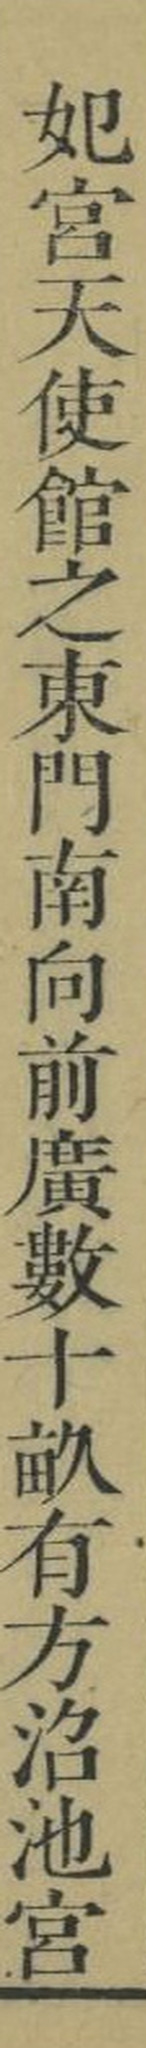妃宮天使館之東門南向前廣數十畝有方沼池宮
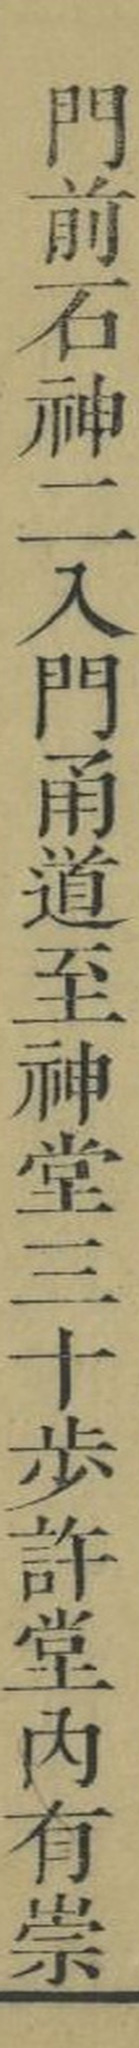門前石神二入門甬道至神堂三十歩許堂内有崇
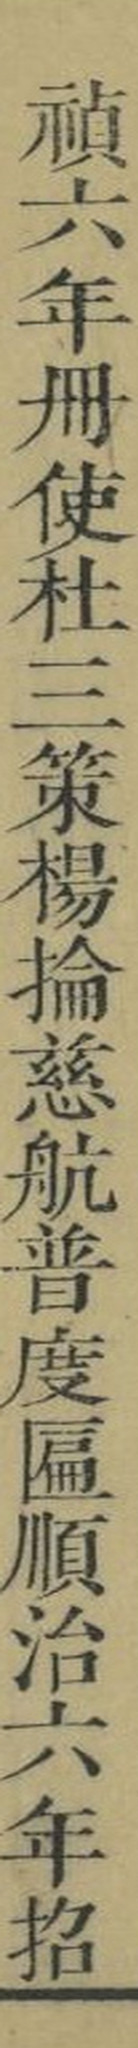禎六年冊使杜三策楊掄慈航普度匾順治六年招
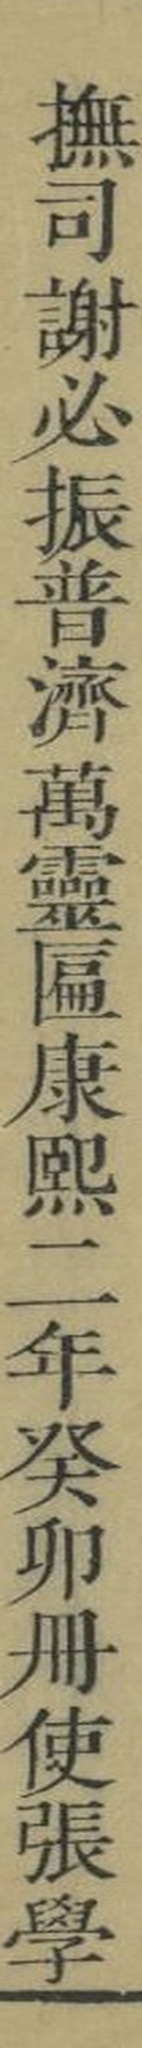撫司謝必振普濟萬靈匾康煕二年癸卯冊使張學
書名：中山伝信録 巻二
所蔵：University of the Ryukyus Library
